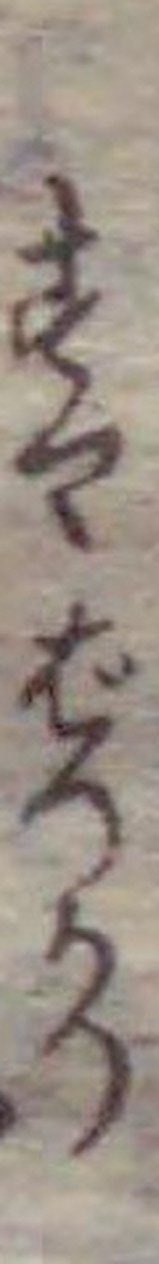すやばつかり
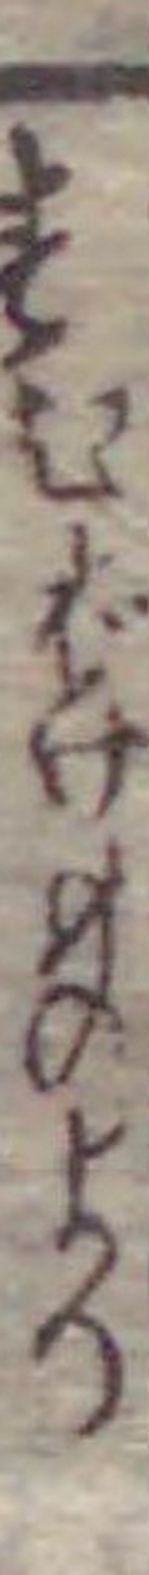すむばけものより
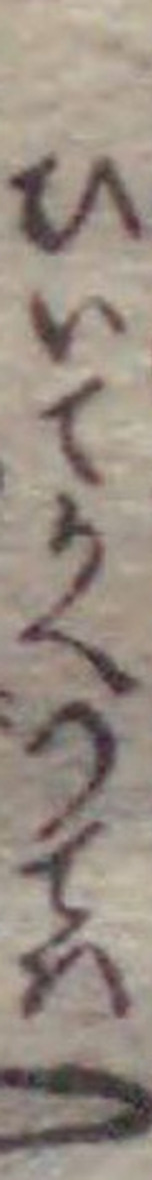ひいてかへつては
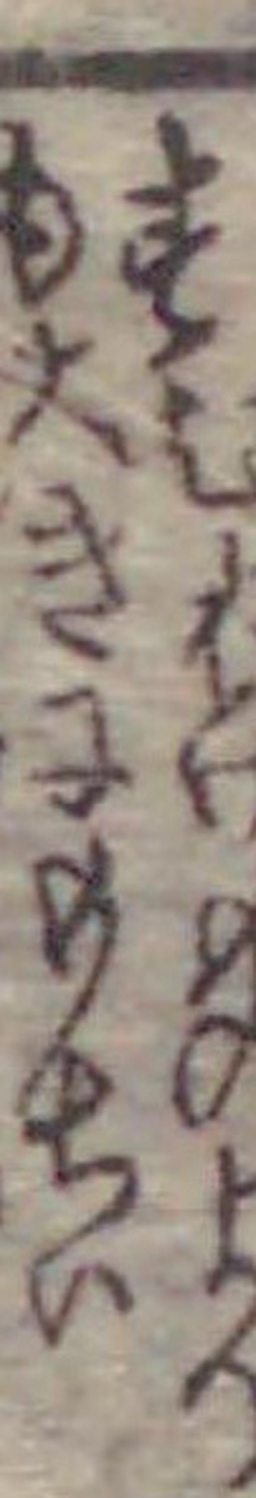も大きにもちい
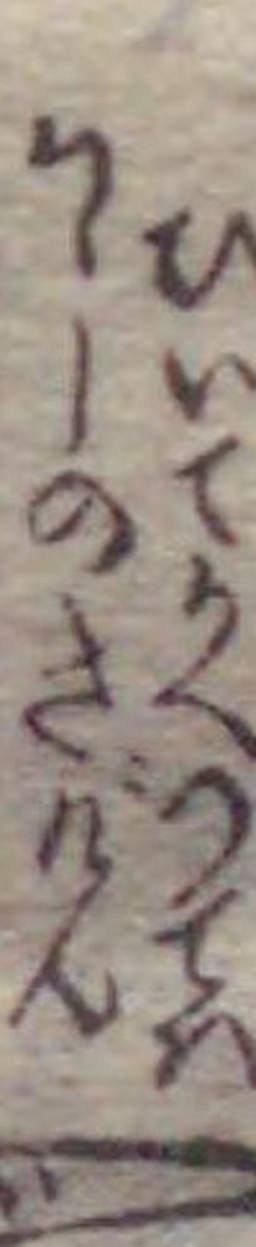かゝしのきげん
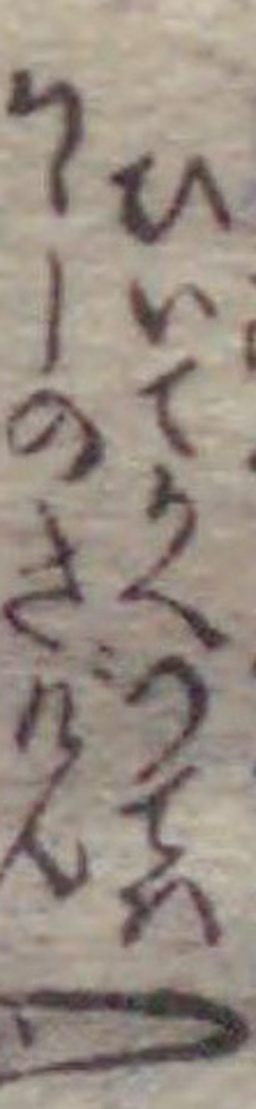かゝしのきげん
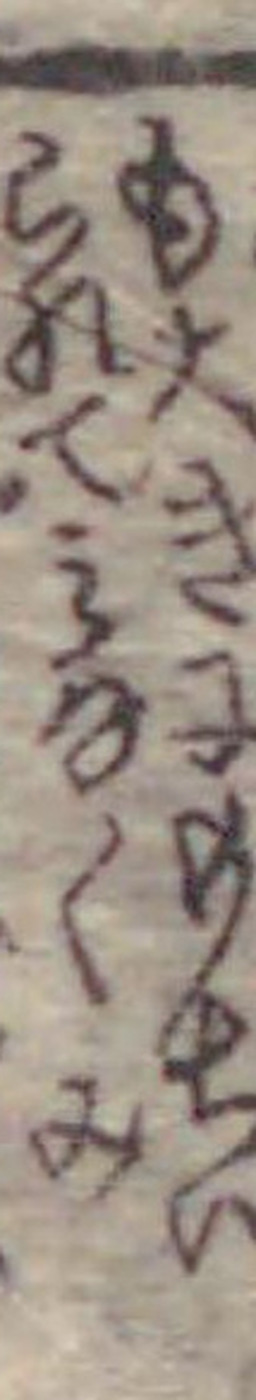られてみな〳〵み
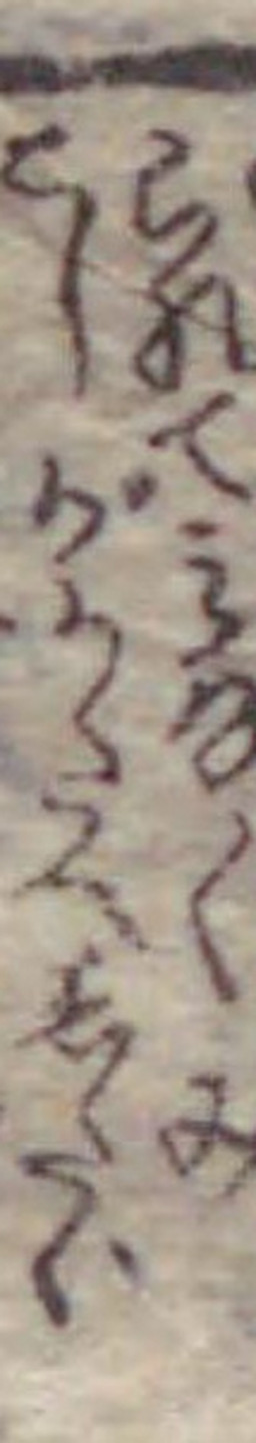こしがかたへしたい
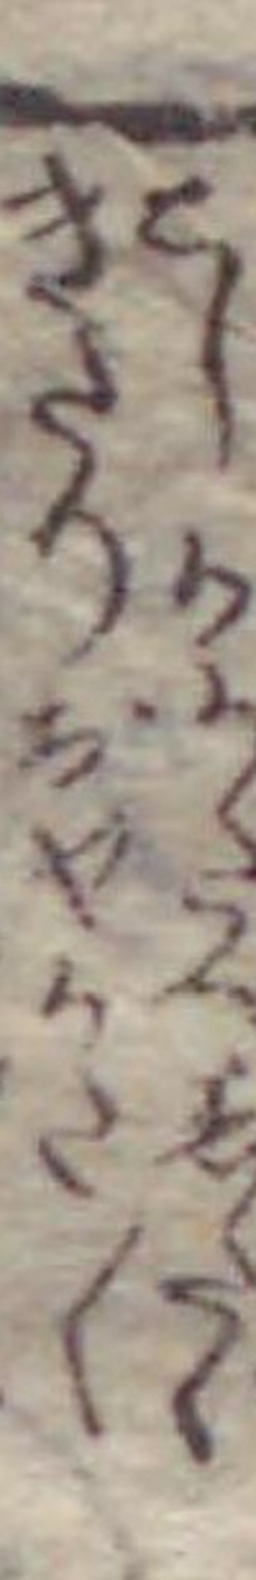きたりおやかた〳〵
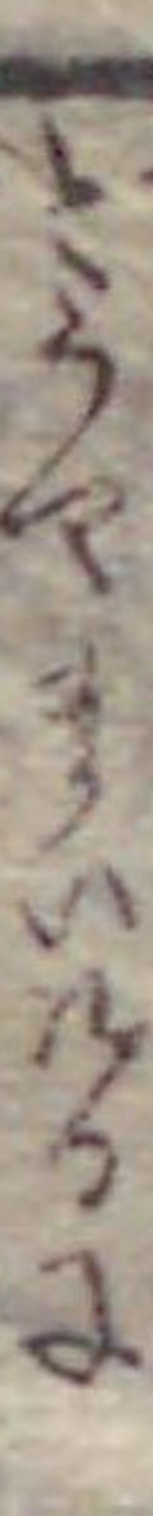とうやまいけるに
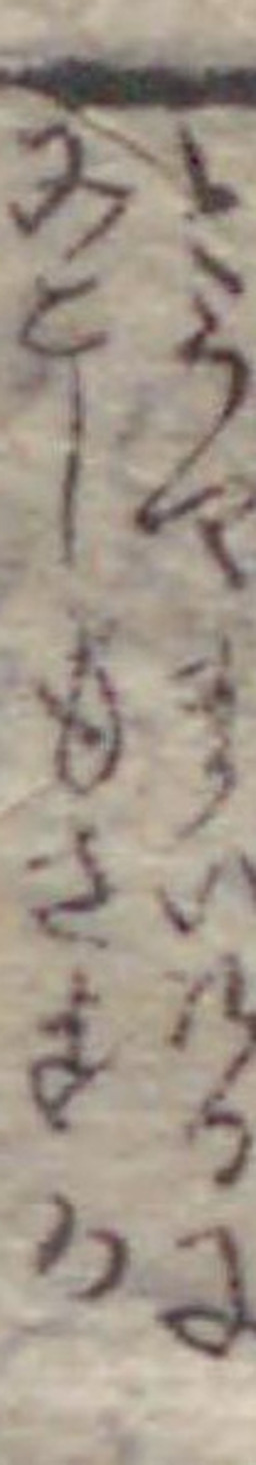みこしもさすか
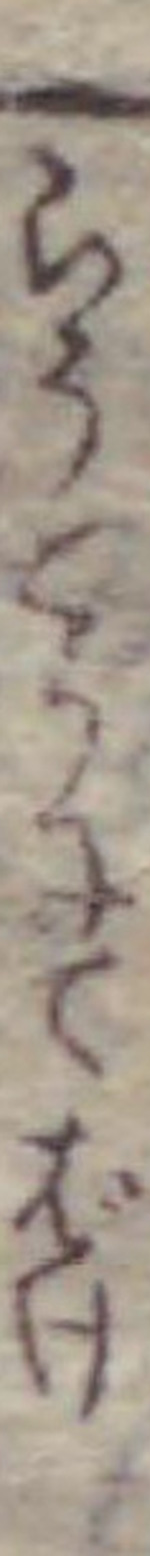らうこうにてばけ
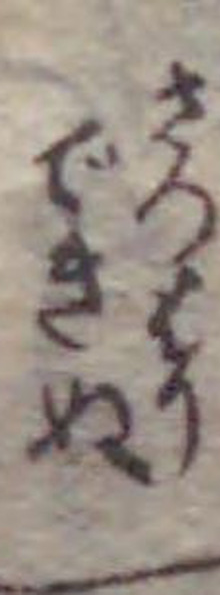できぬ
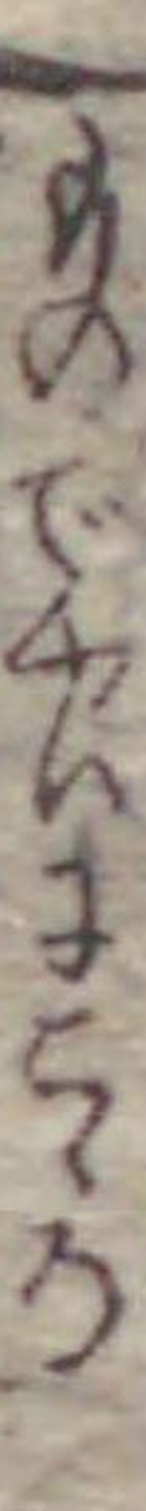ものでやいにこゝろ
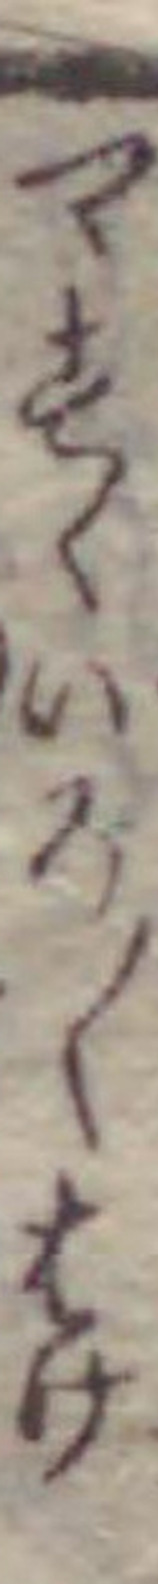やすくいろ〳〵はけ
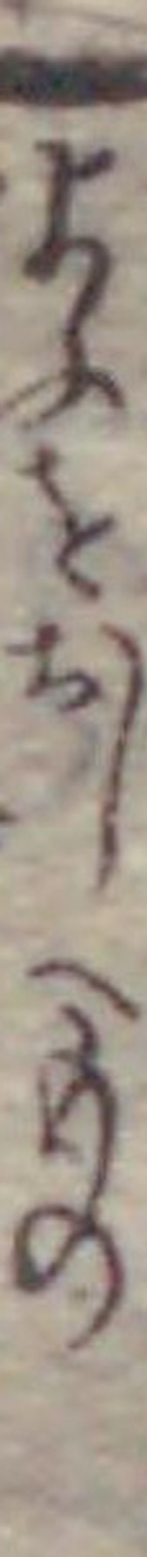よふをおしへもの
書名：化物見世開 : 2巻
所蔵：国立国会図書館 National Diet Library, JAPAN
